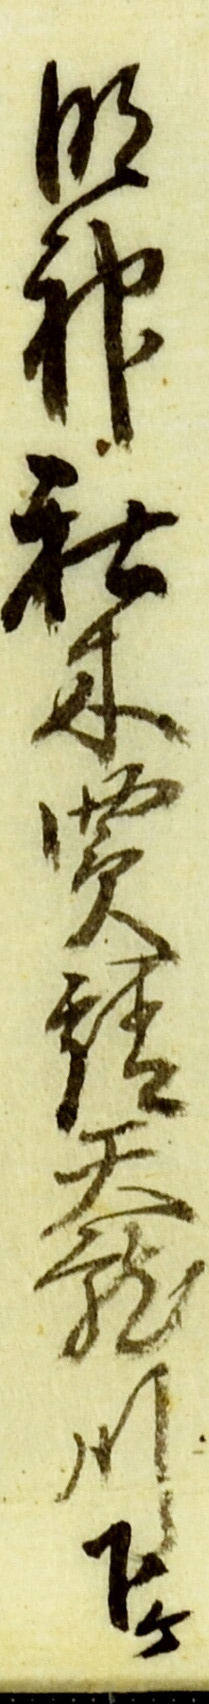明神社木買請天龍川下ヶ
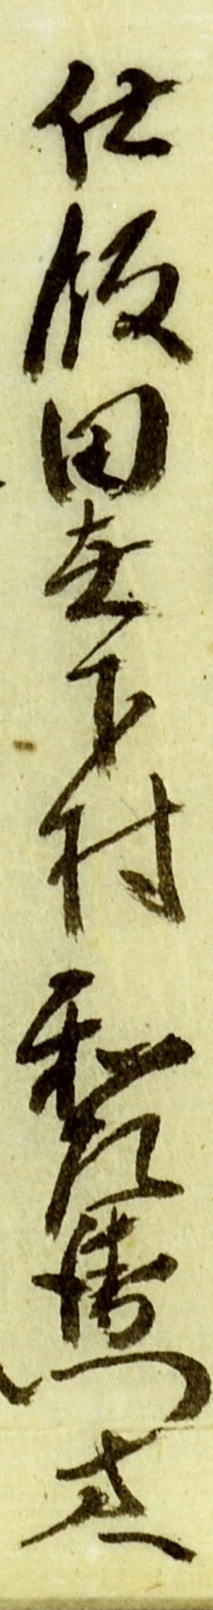仕飯田在下村和左衛門方へ
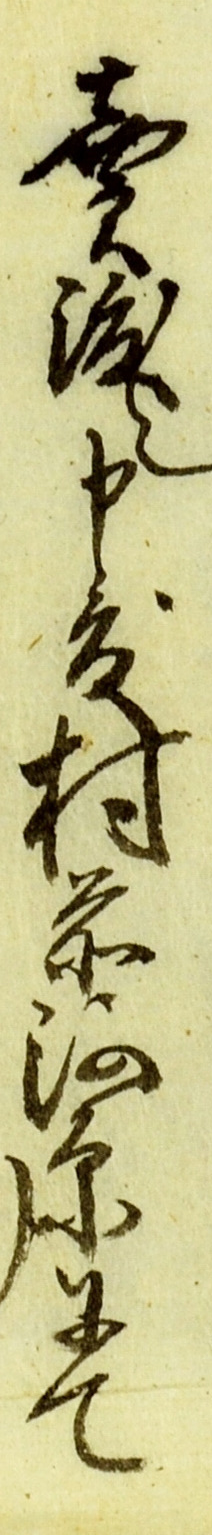売渡し申度村前河原にて
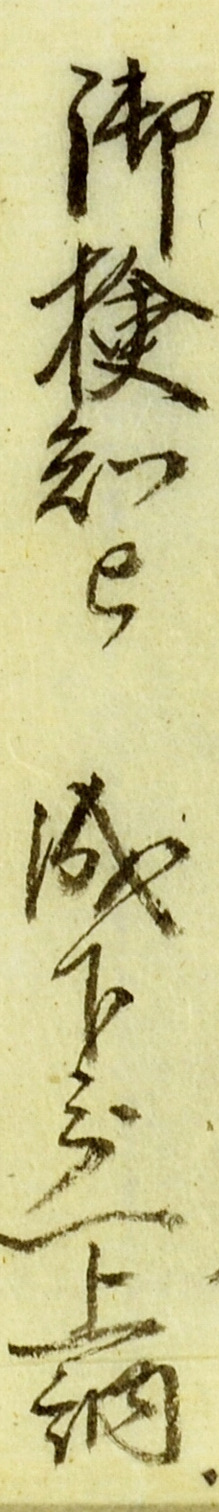御検知被成下分一上納
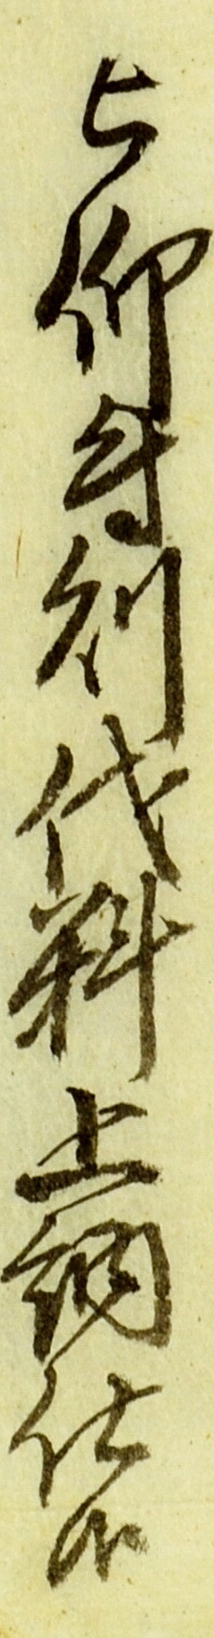被仰付則代料上納仕候
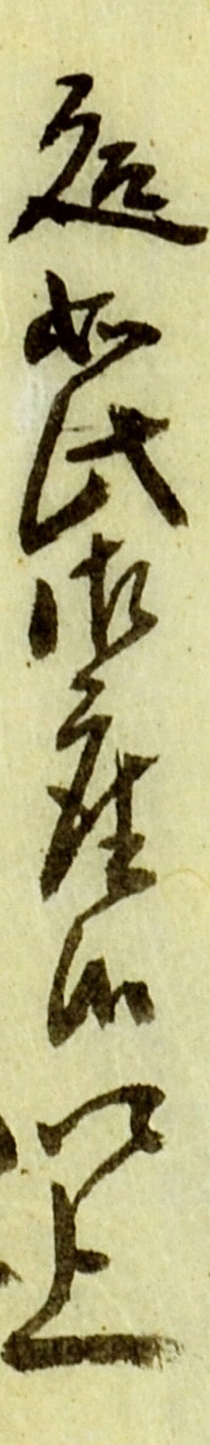趣如此御座候以上
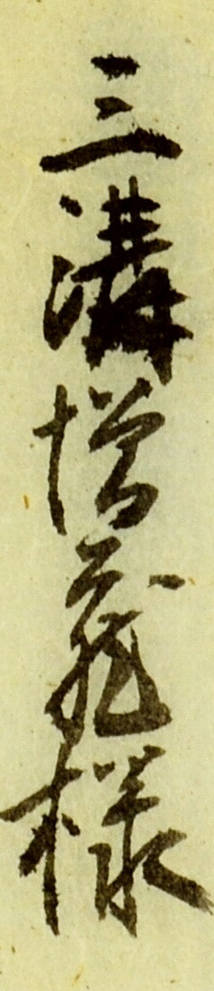三溝増蔵様
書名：材木川下ケ分一上納帳
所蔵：伊那市立高遠町図書館・合同会社AMANE
